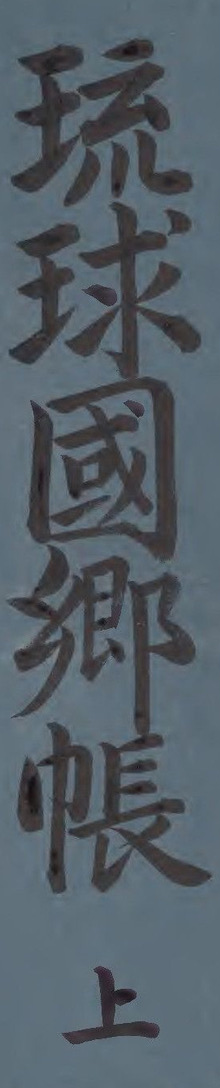琉球国郷帳上

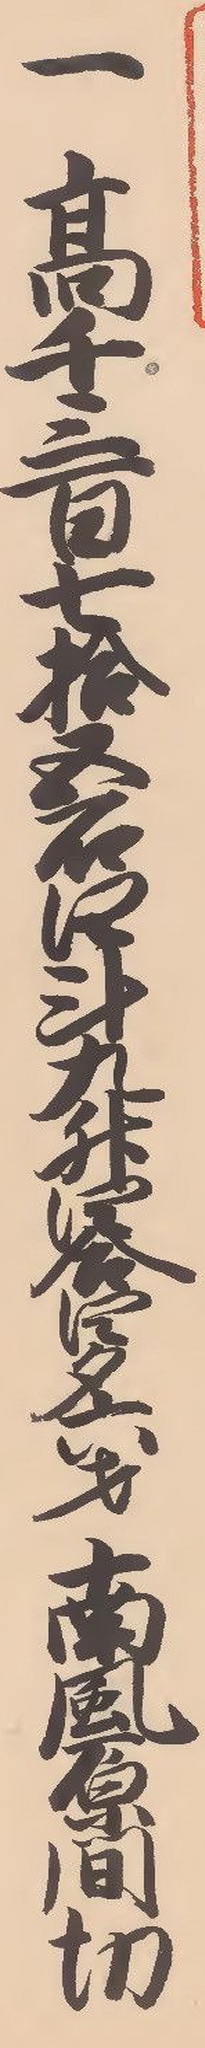一高千三百七拾五石四斗九升四合四勺六才南風原間切
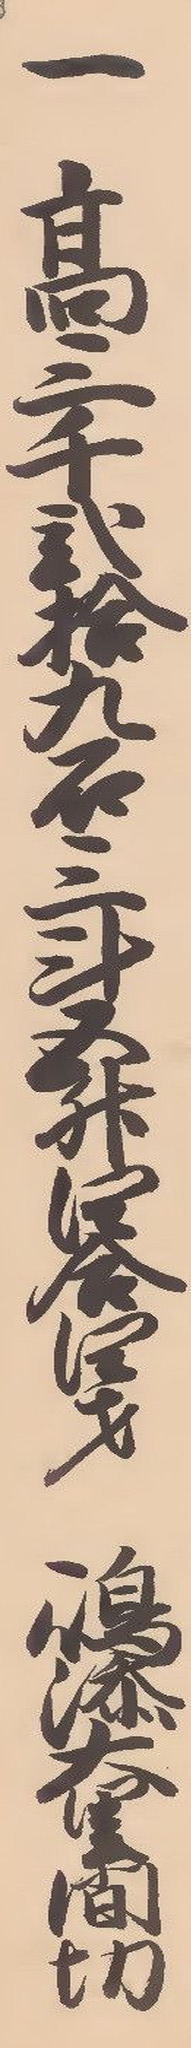一高三千弐拾九石三斗五升四合四才嶋添大里間切

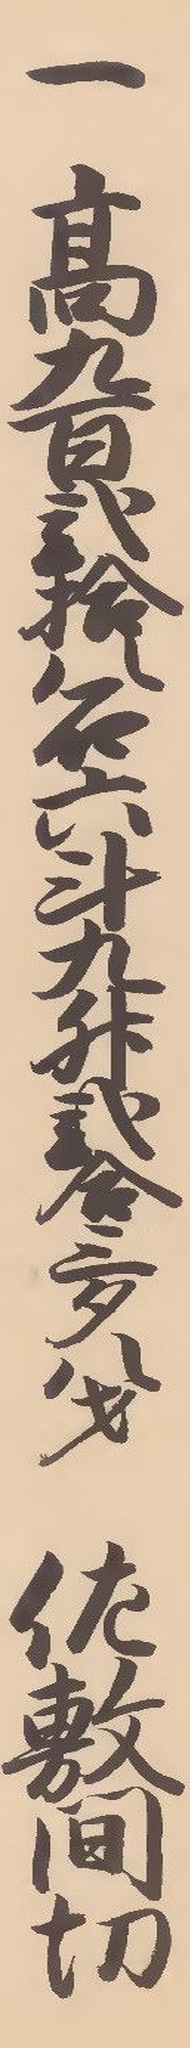一高九百弐拾八石六斗九升弐合三勺八才佐敷間切
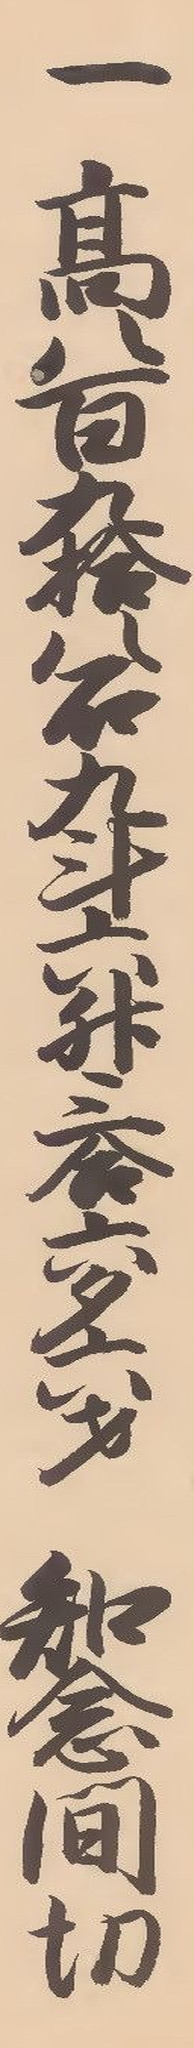一高八百九拾八石九斗六升三合六勺六才知念間切
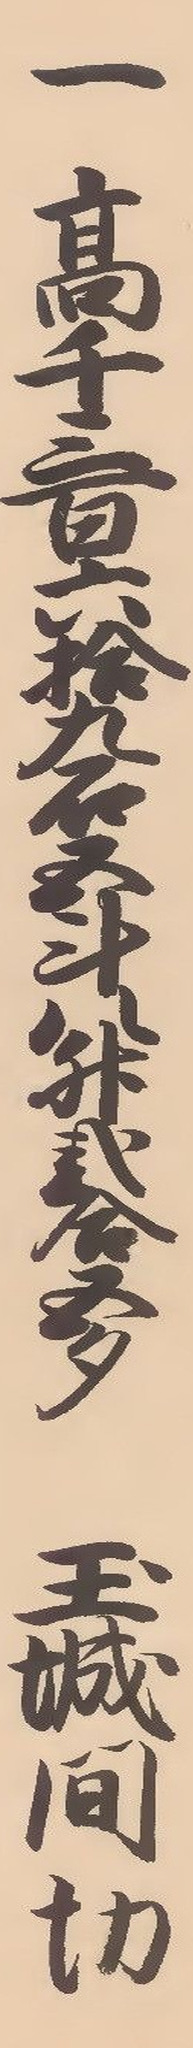一高千三百六拾九石五斗八升弐合五勺玉城間切
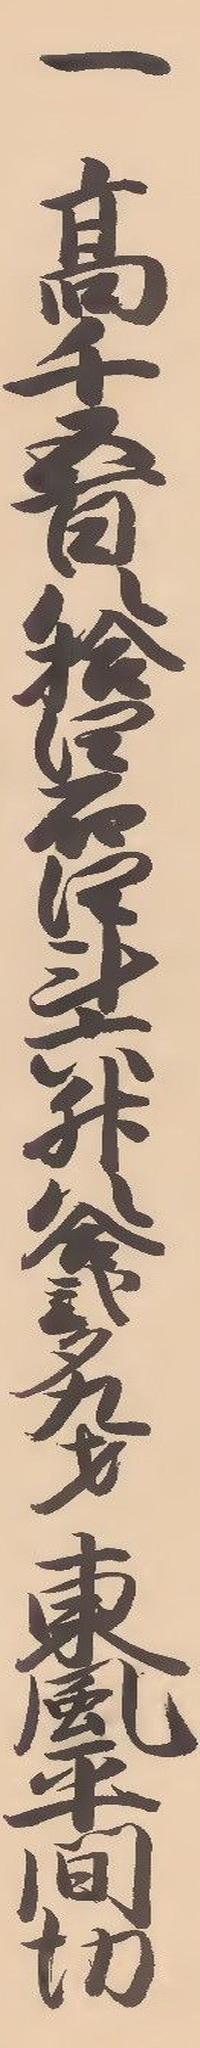一高千五百八拾四石四斗六升八合弐勺九才東風平間切
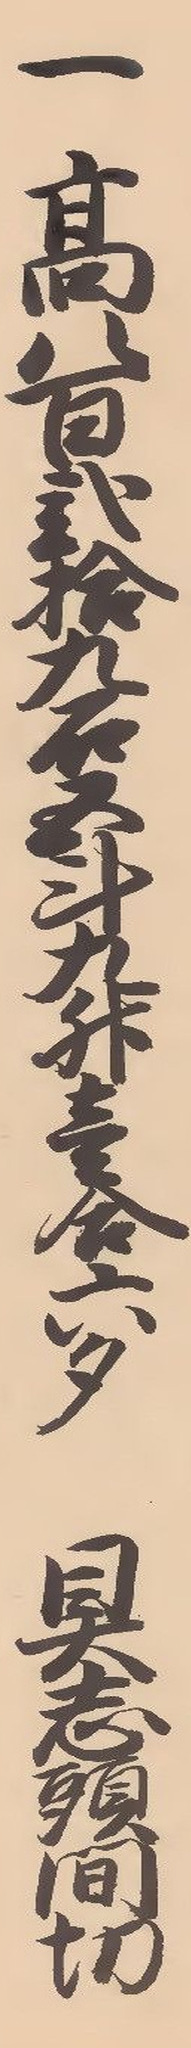一高八百弐拾九石五斗九升壱合六勺具志頭間切
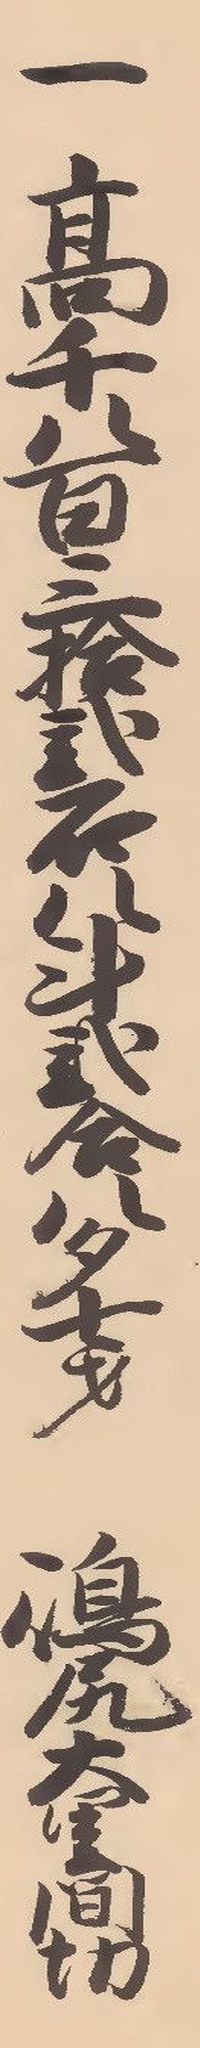一高千八百三拾弐石八斗弐合八勺七才嶋尻大里間切
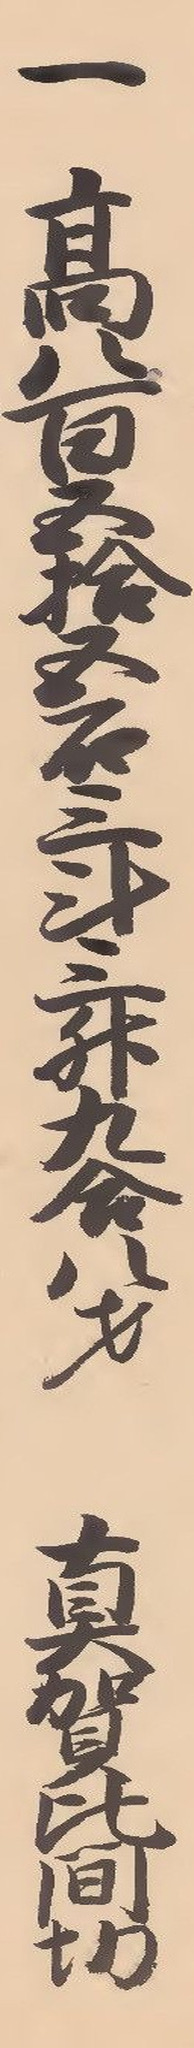一高八百五拾五石三斗三升九合八才真賀比間切
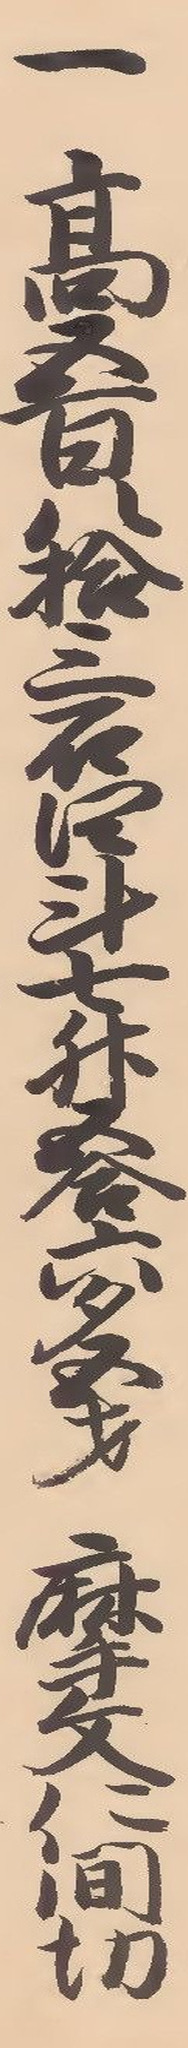一高五百八拾三石四斗七升五合六勺五才摩文仁間切

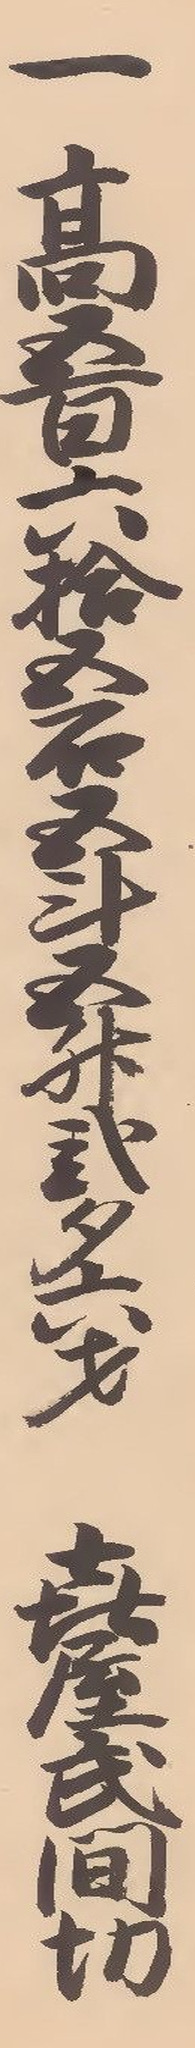一高五百六拾五石五斗五升弐勺六才喜屋武間切
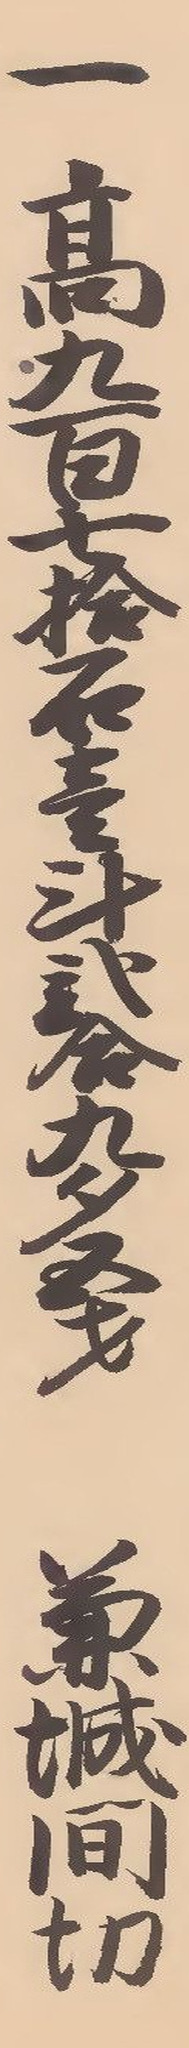一高九百七拾石壱斗弐合九勺五才兼城間切
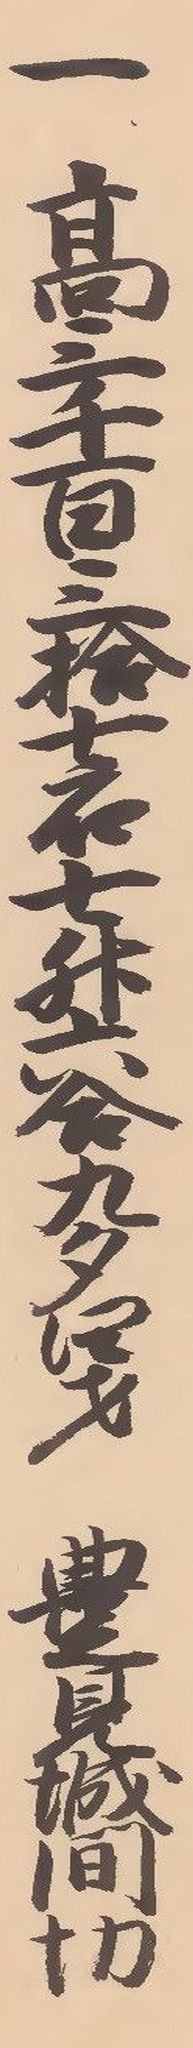一高三千百三拾七石七升六合九勺四才豊見城間切
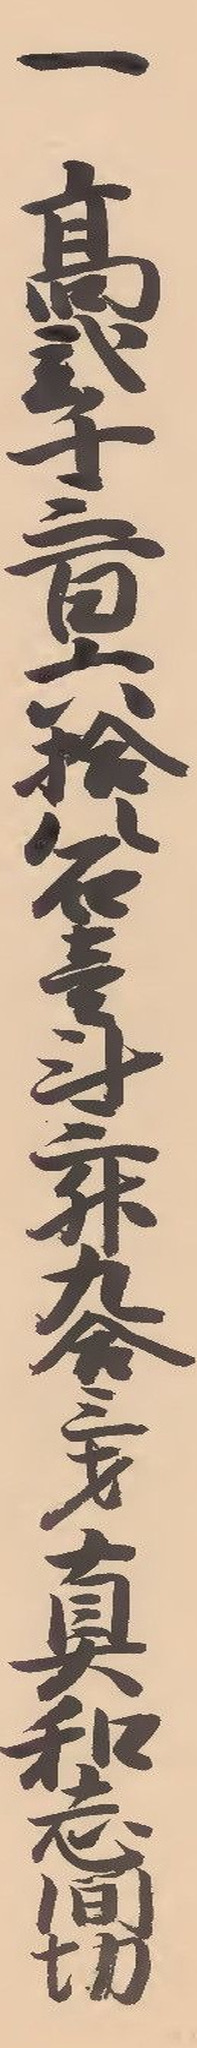一高弐千三百六拾八石壱斗三升九合三才真和志間切
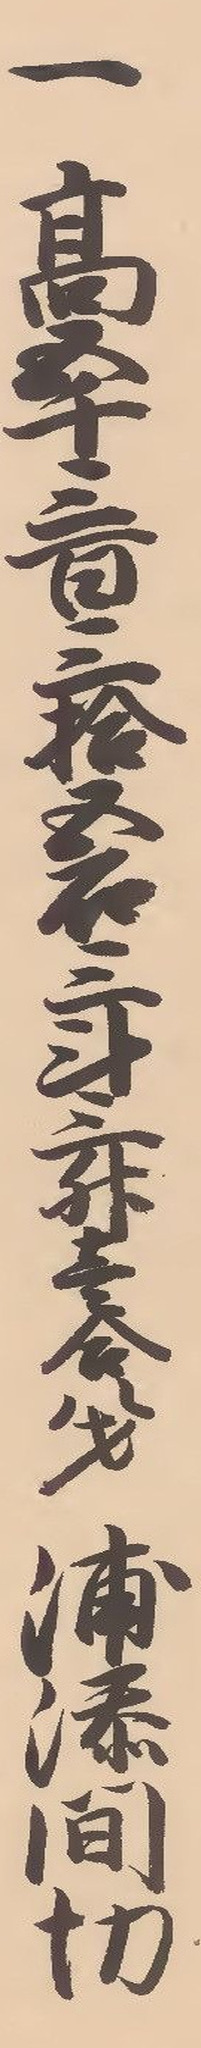一高五千三百三拾五石三斗三升壱合八才浦添間切
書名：琉球国郷帳　上
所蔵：国立公文書館 National Archives of Japan
